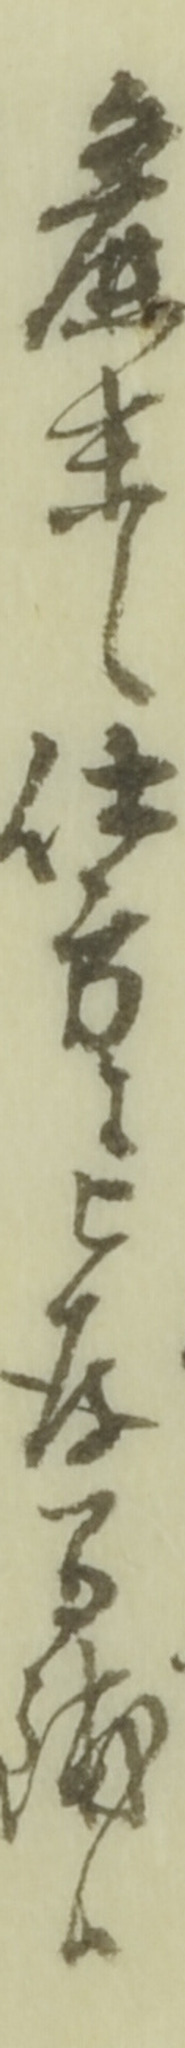麁末之仕方与被存間鋪候
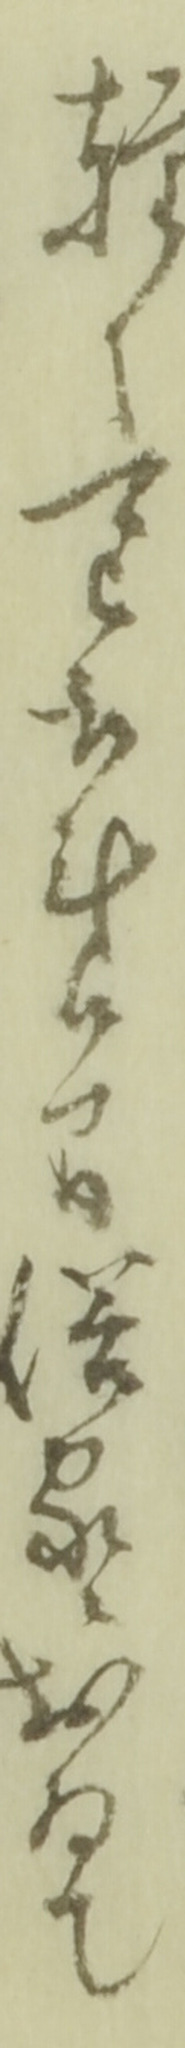軽く可被取斗候間俗家におゐて
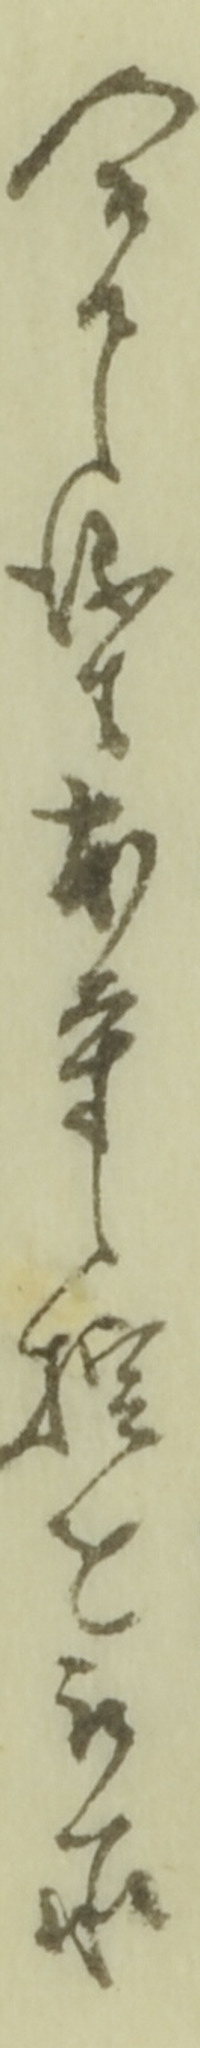合候之儀者本寺之掟を被承
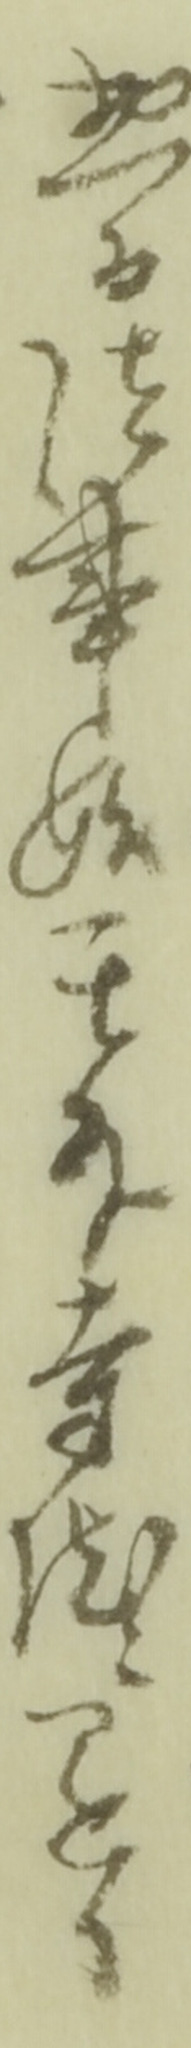惣而法事之始其外寺院ニ懸り
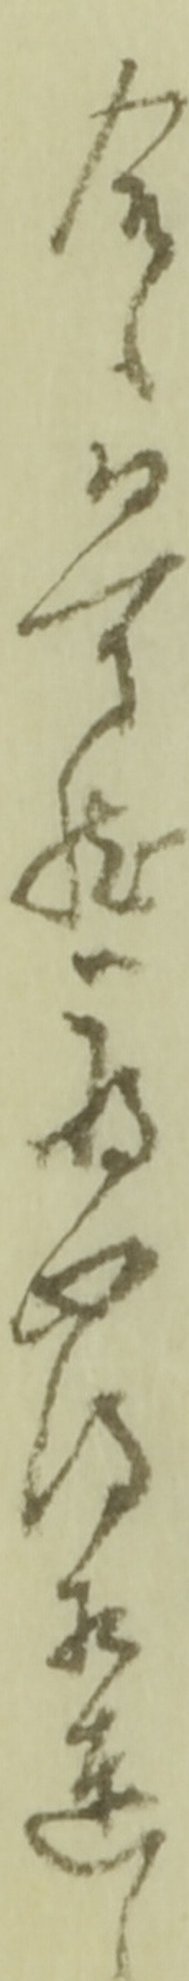合候而可然為心得相達候
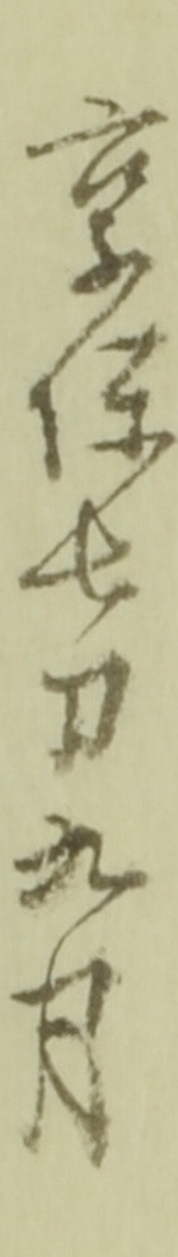享保七刁九月
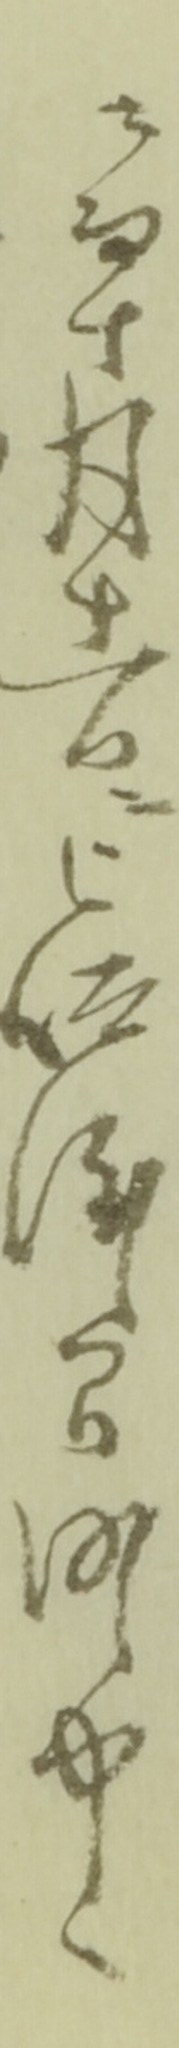ニ而十月十一日ニ被仰渡候間町中へ
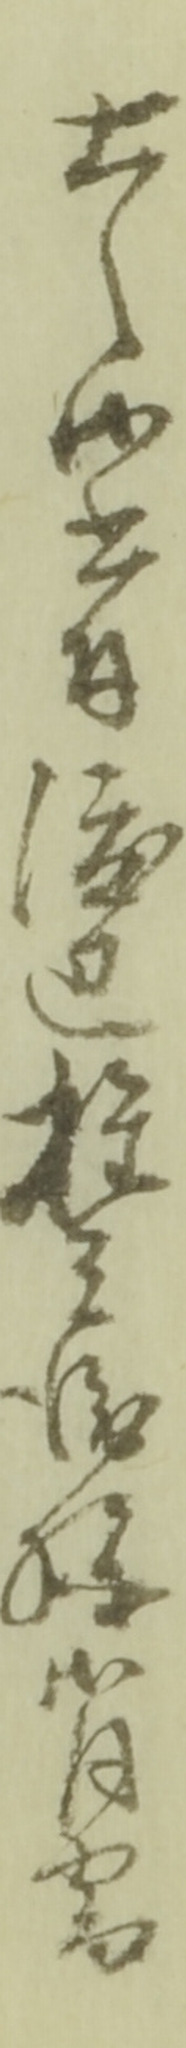右之御書付渡辺権兵衛様御月番
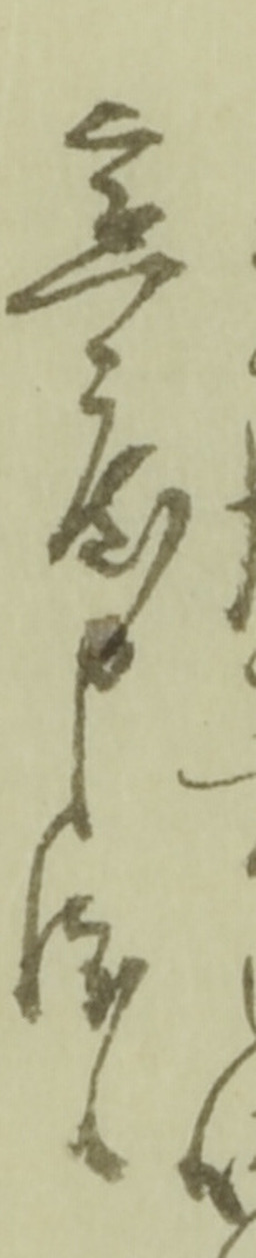急度申渡候
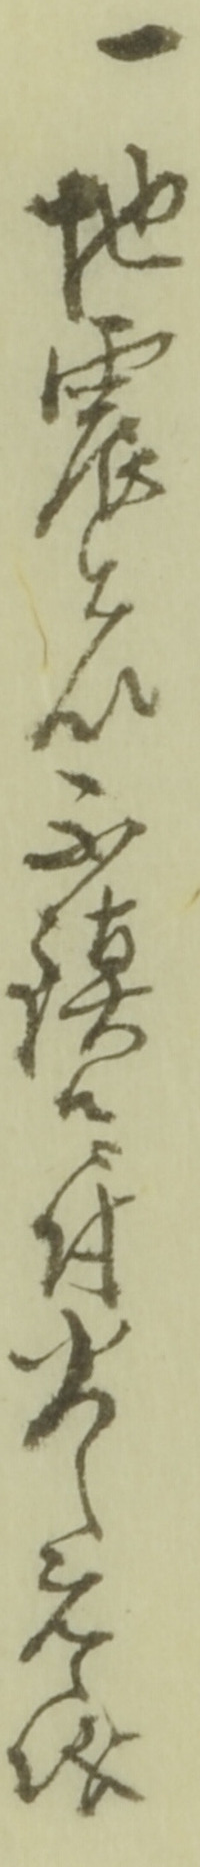一地震今以不鎮候二付火之元之儀
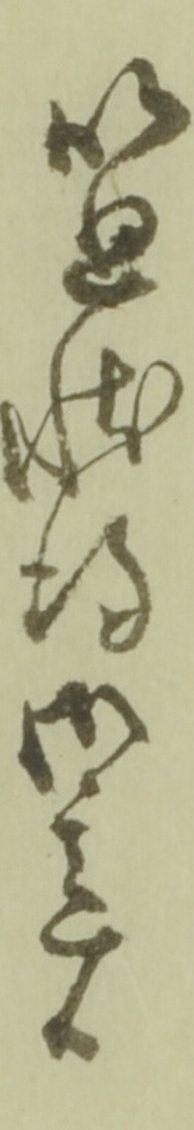以廻状得御意候
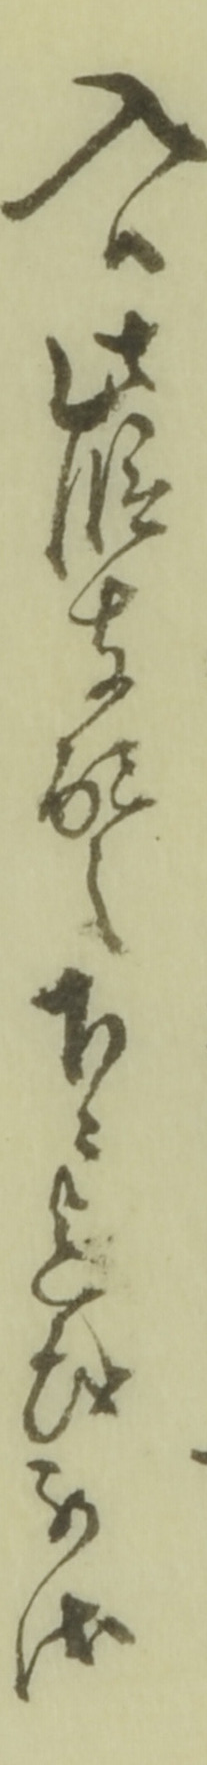入候此段支配之下々迄茂被御
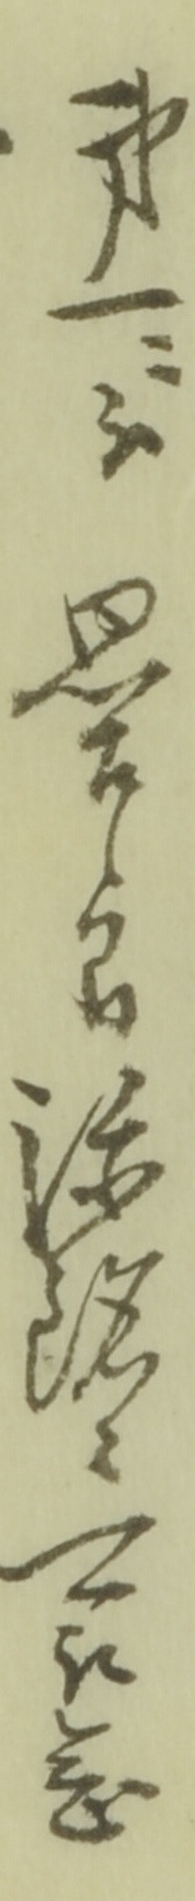第一ニ被思召候間弥銘々可被念
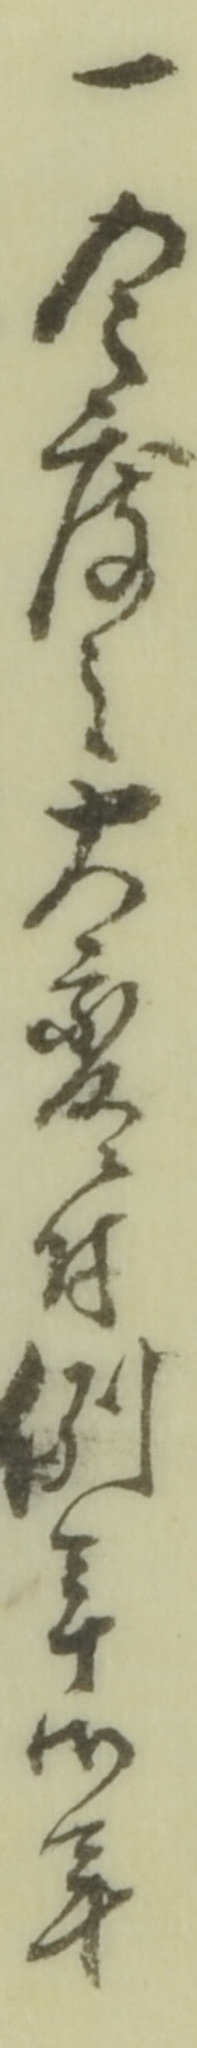一今度之大変ニ付例年御年
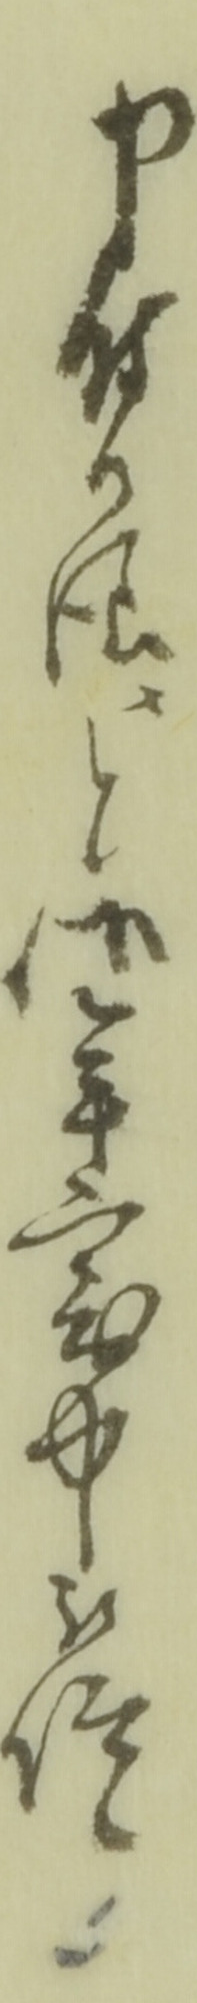申付候様ニと御年寄中被仰候
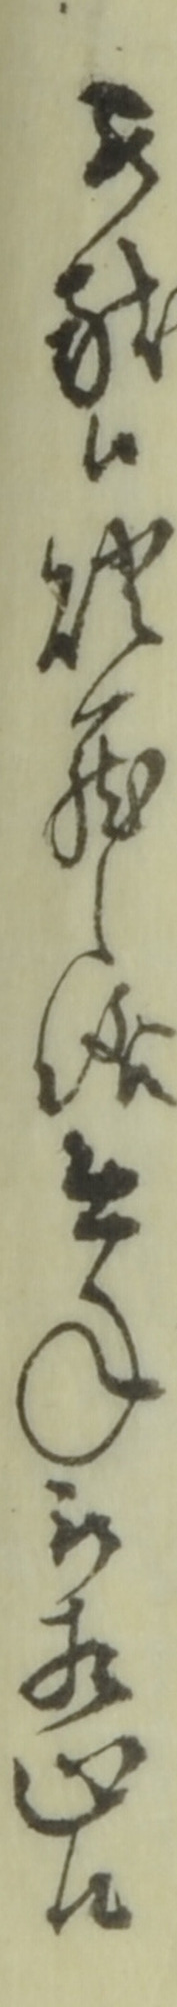相献候燈籠之儀今年被相止候
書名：御公儀様御領主様御触書控
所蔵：伊那市立高遠町図書館・合同会社AMANE
